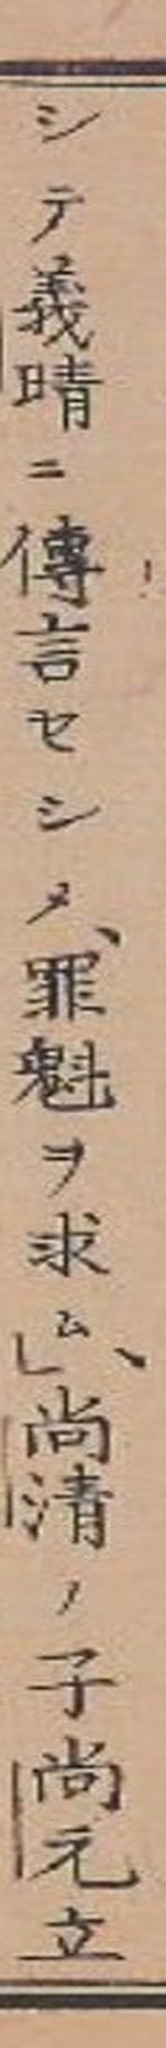シテ義晴ニ伝言セシメ、罪魁ヲ求ム、」尚清ノ子尚元立
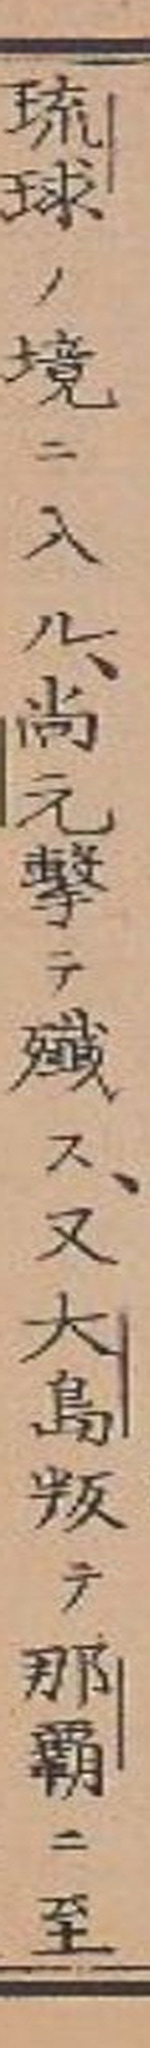琉球ノ境ニ入ル、尚元撃テ殲ス、又大島叛テ那覇ニ至
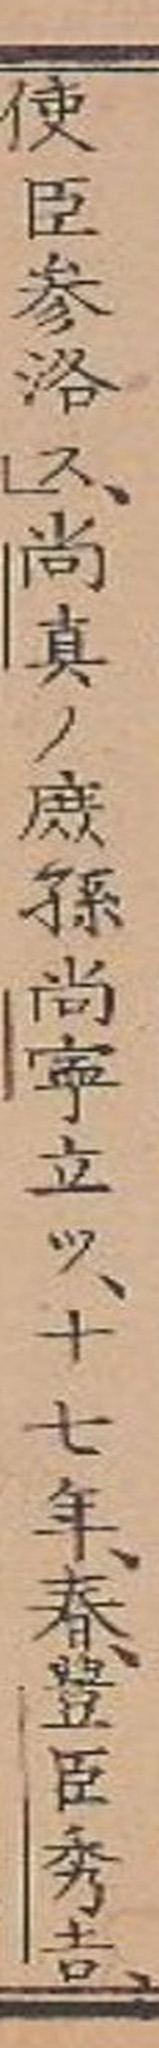使臣参洛ス、」尚真ノ庶孫尚寧立ツ、十七年、春、豊臣秀吉、
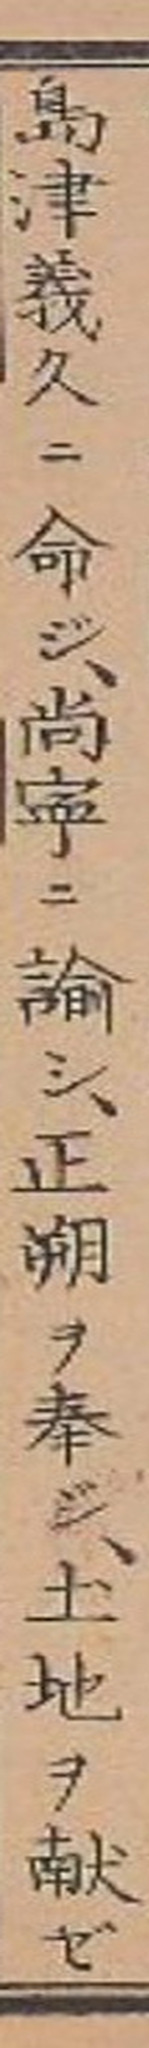島津義久ニ命ジ、尚寧ニ諭シ、正朔ヲ奉ジ、土地ヲ献ゼ
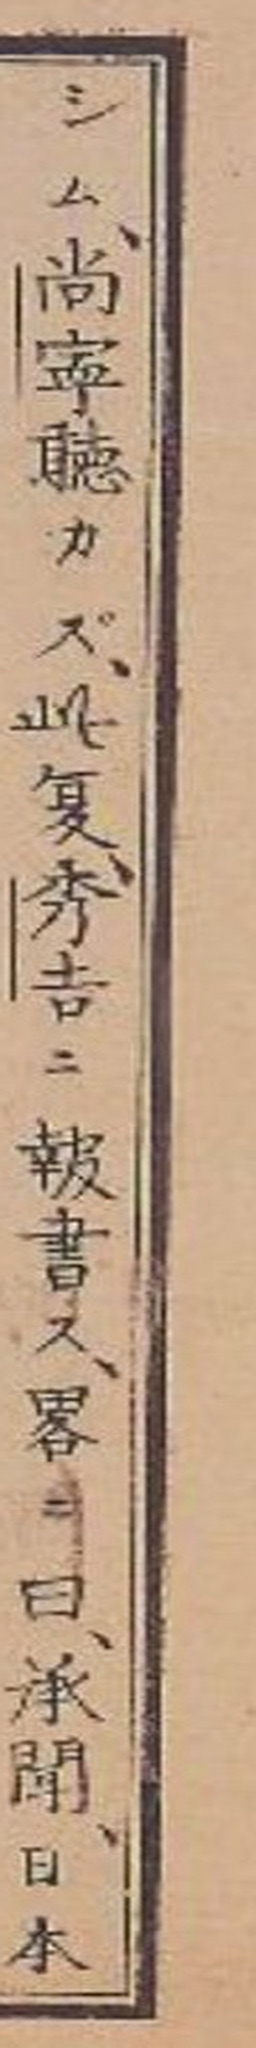シム、尚寧聴カズ、此夏、秀吉ニ報書ス、略ニ曰、承聞、日本
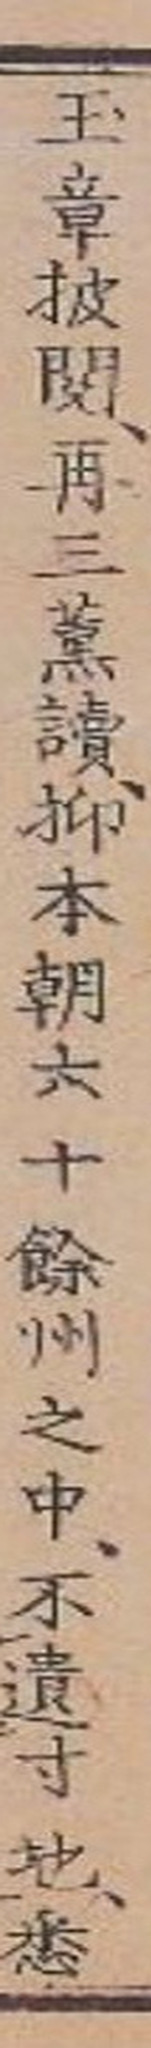玉章披閲、再三薫読、抑本朝六十余州之中、不遺寸地、悉
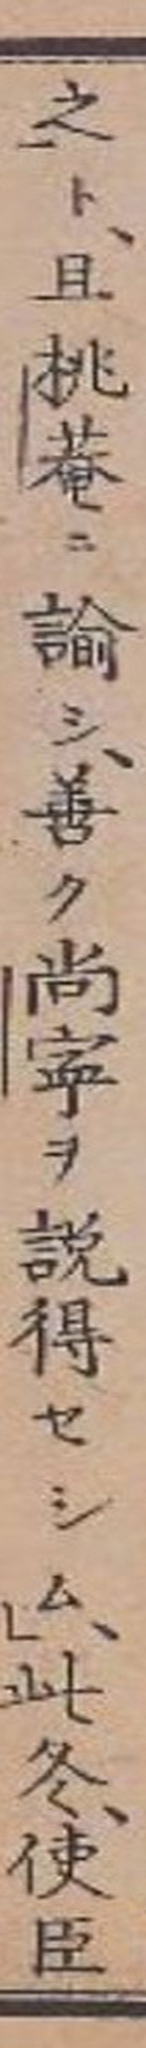之ト、且桃菴ニ諭シ、善ク尚寧ヲ説得セシム、」此冬、使臣
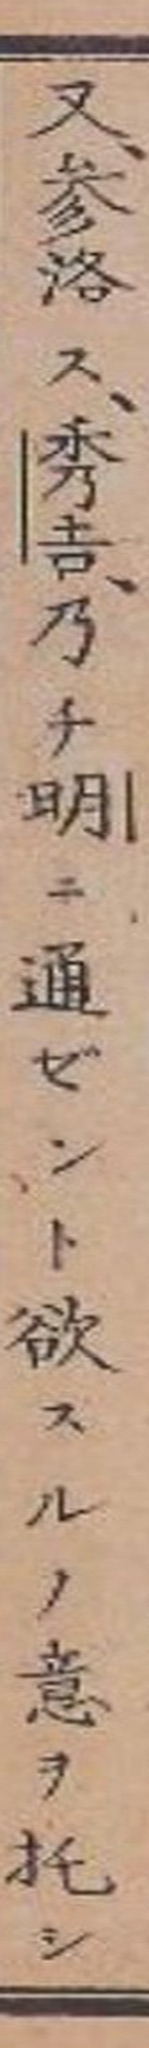又、参洛ス、秀吉、乃チ明ニ通ゼント欲スルノ意ヲ托シ

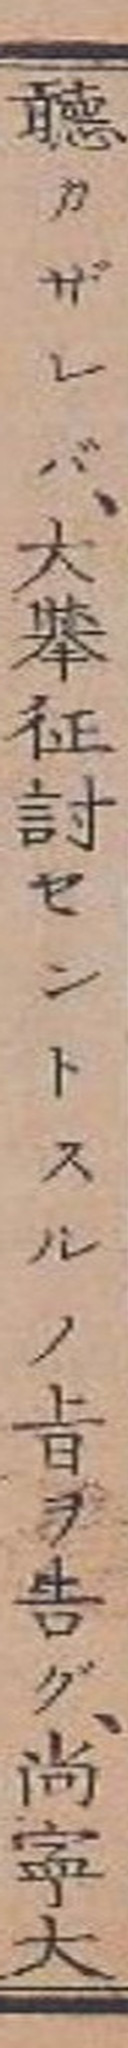聴カザレバ、大挙征討セントスルノ旨ヲ告グ、尚寧大
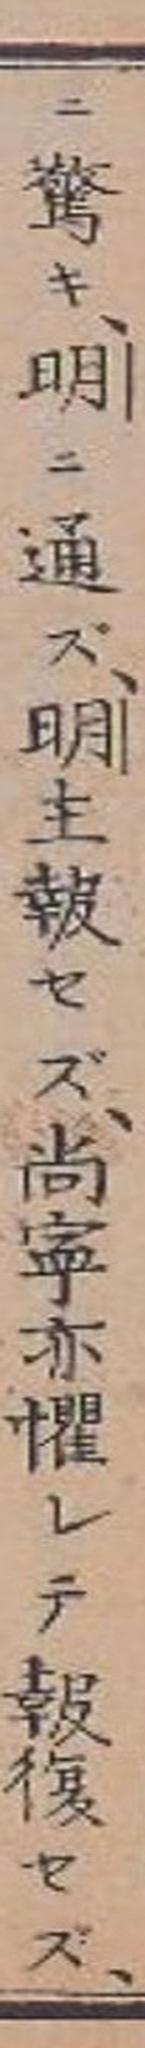ニ驚キ、明ニ通ズ、明主報セズ、尚寧亦懼レテ報復セズ、
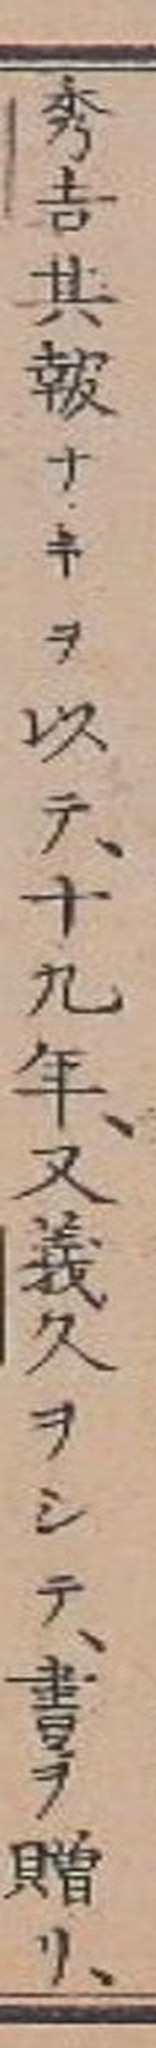秀吉其報ナキヲ以テ、十九年、又義久ヲシテ、書ヲ贈リ、
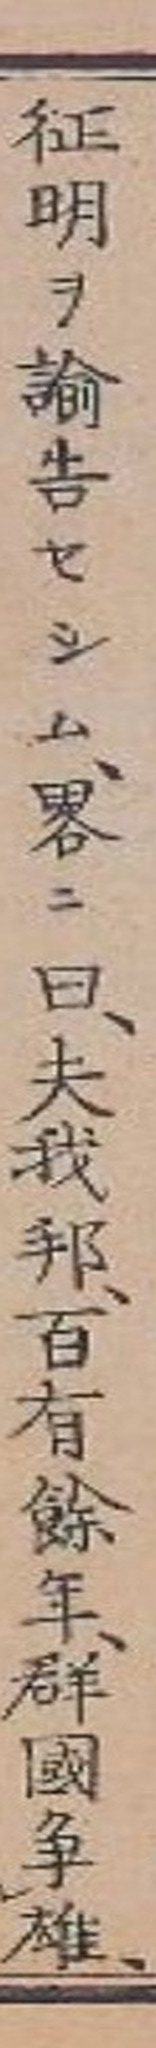征明ヲ諭告セシム、略ニ曰、夫我邦、百有余年、群国争雄、
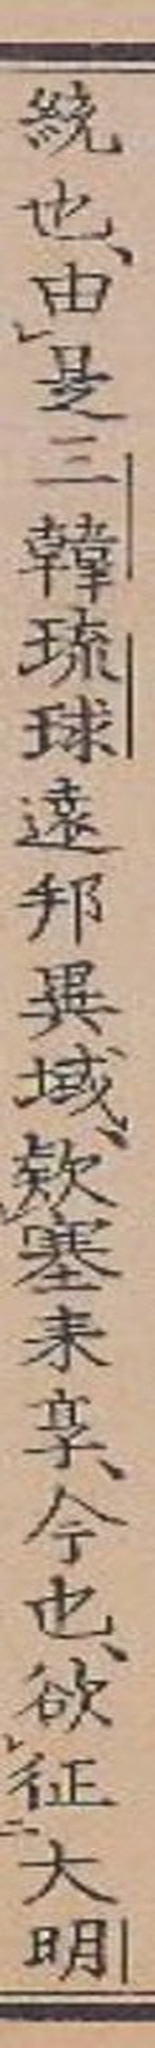統也、由是三韓琉球遠邦異域、欵塞来享、今也、欲征大明
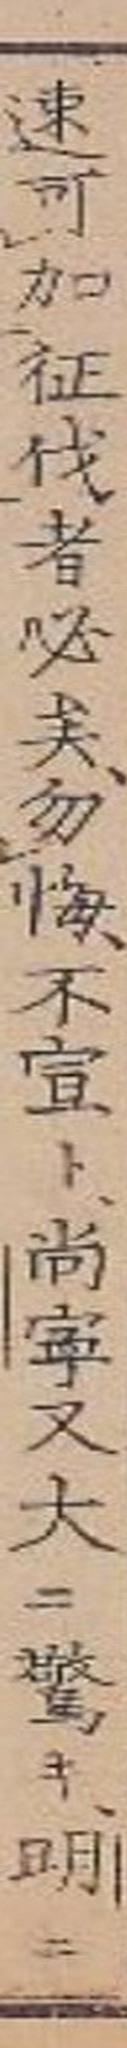速可加征伐者必矣、勿悔、不宣ト、尚寧又大ニ驚キ、明ニ
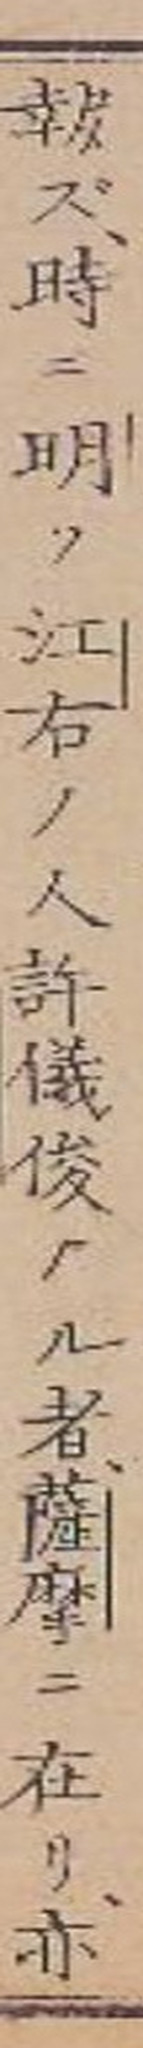報ズ、時ニ明ノ江右ノ人許儀俊ナル者、薩摩ニ在リ、亦
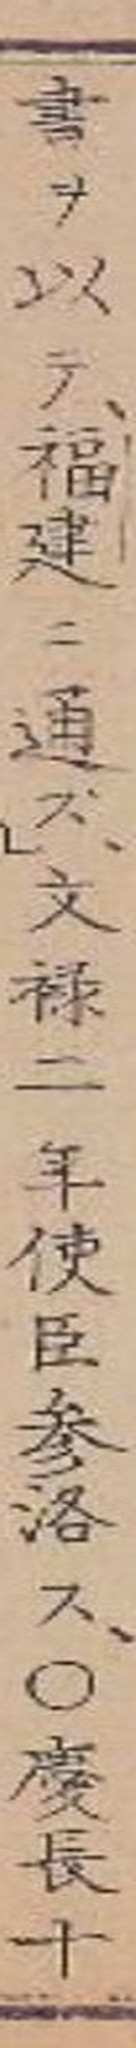書ヲ以テ、福建ニ通ズ、」文禄二年使臣参洛ス、○慶長十
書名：琉球新誌 巻上
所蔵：University of the Ryukyus Library
